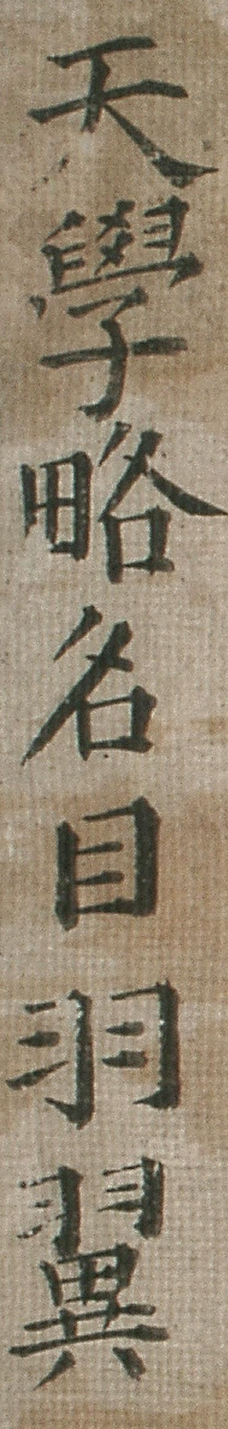天學略名目羽翼全

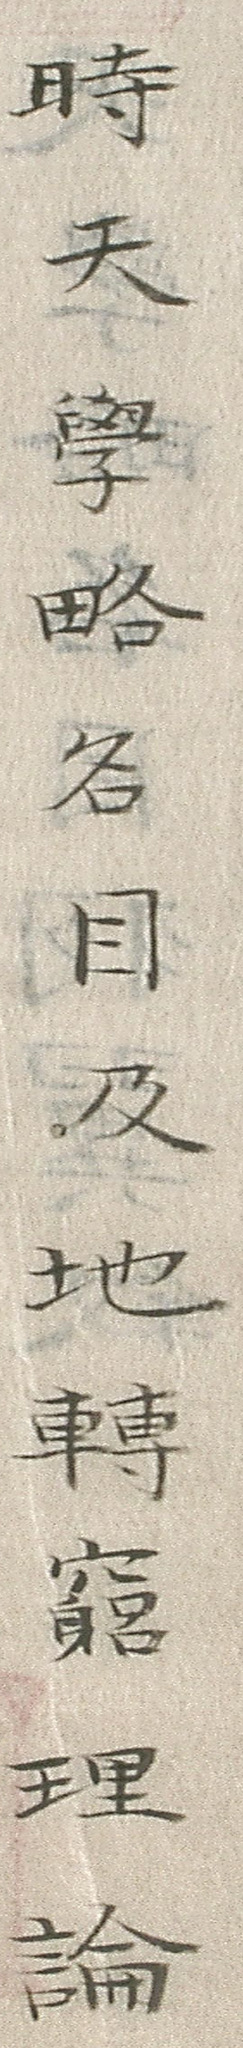時天學略名目及地轉窮理論

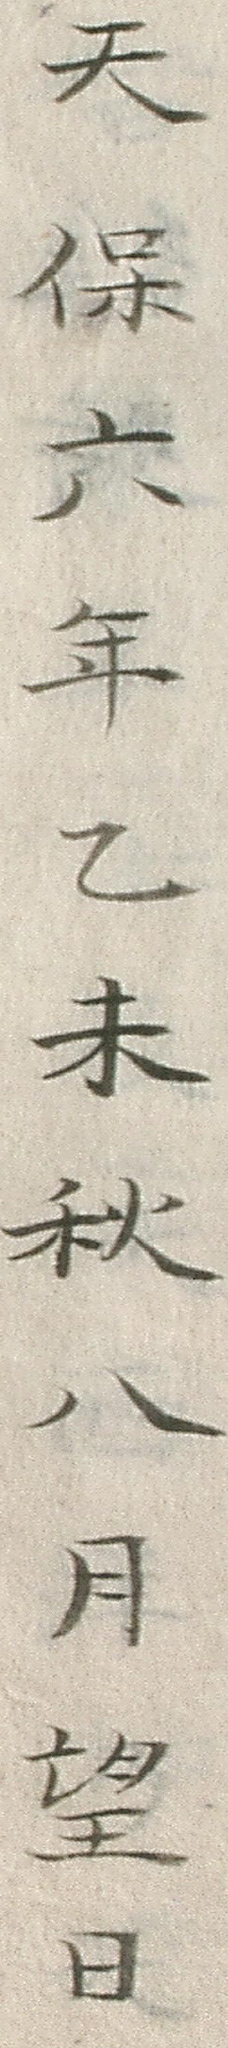天保六年乙未秋八月望日
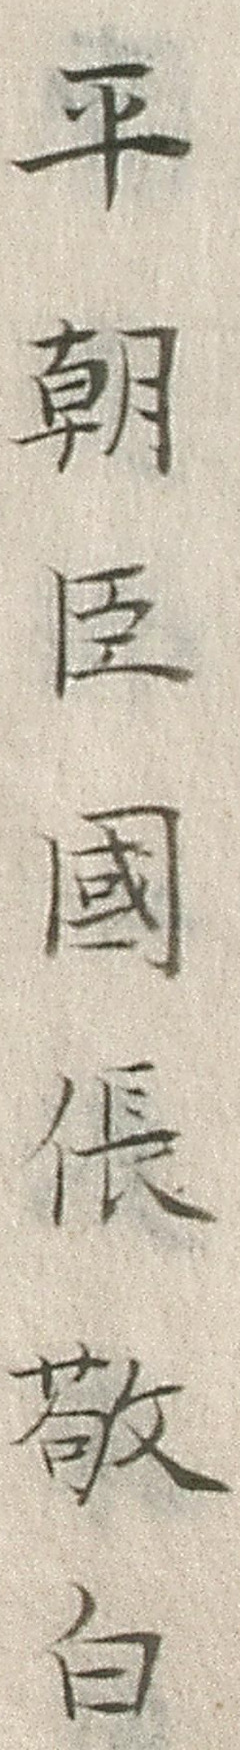平朝臣國倀敬白

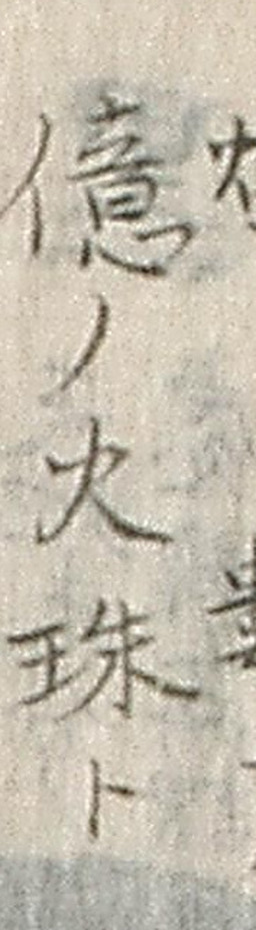億ノ火珠ト
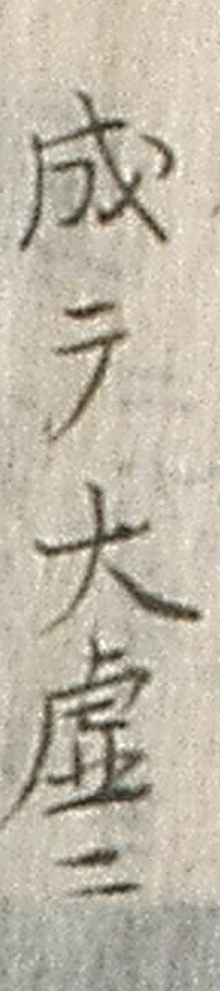成テ大虚ニ
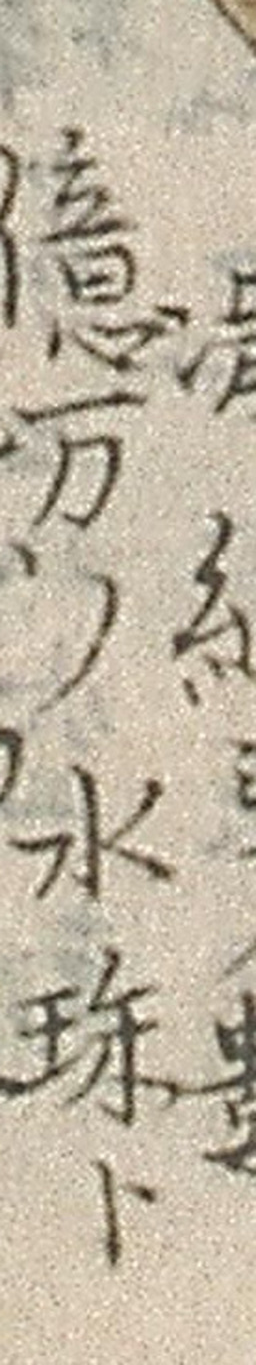億ノ火珠ト
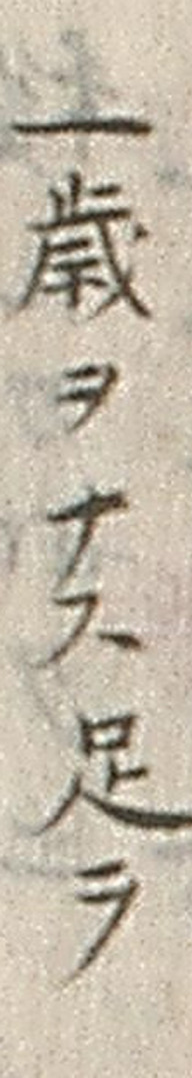一歳ヲナス足ヲ月
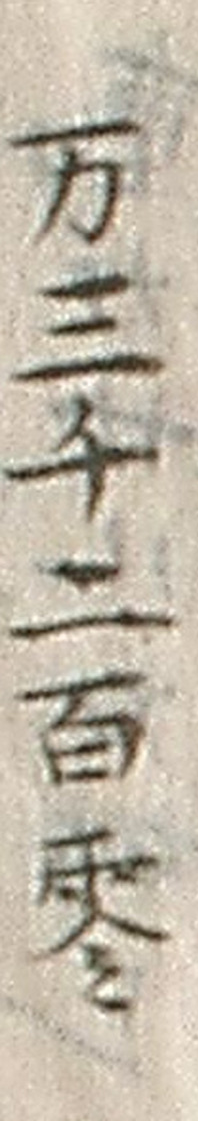万三千二百零
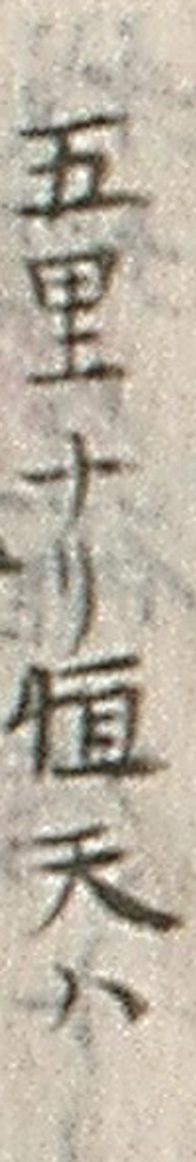五里ナリ恒天ハ
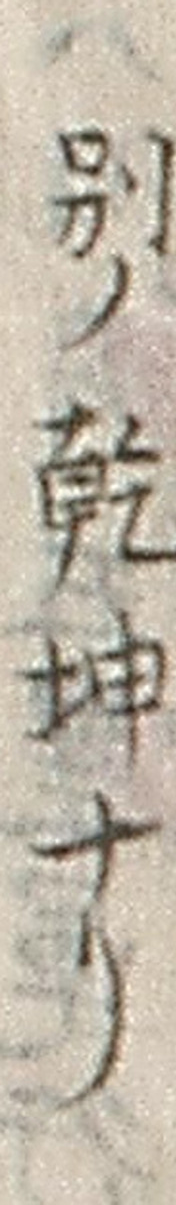別ノ乾坤ナリ

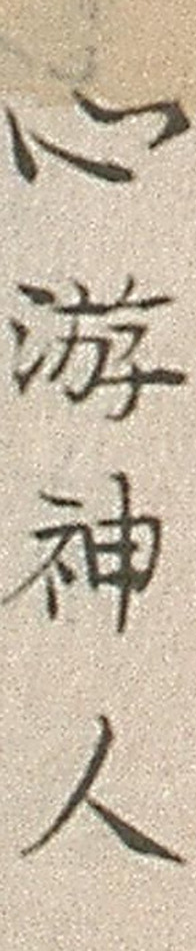心游神人
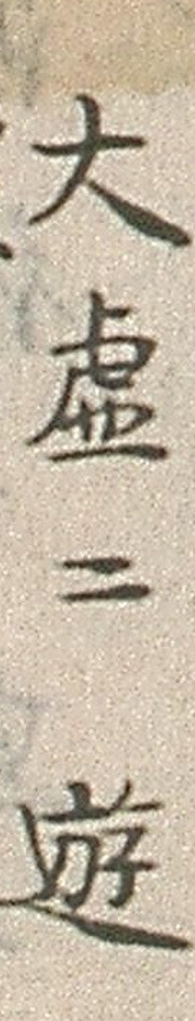大虚ニ遊
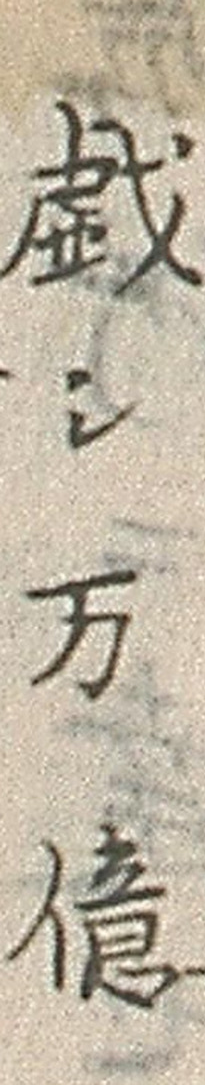戯シ万億
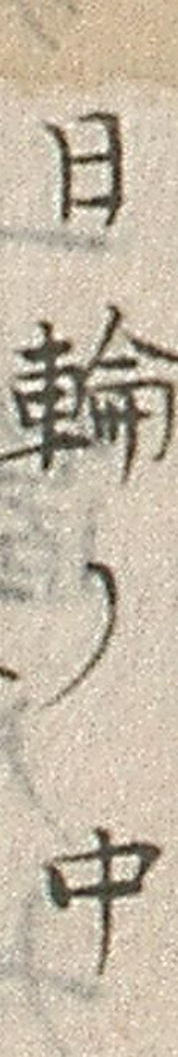日輪ノ中
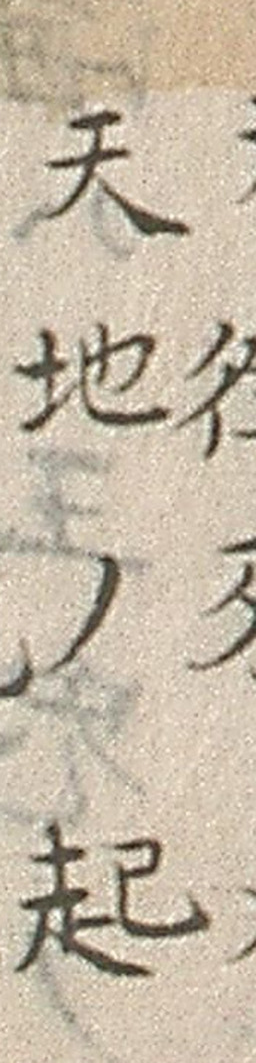天地ノ起
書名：天學略名目羽翼　全
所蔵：東京大学地震研究所図書室 Earthquake Research Institute Library, The University of Tokyo, JAPAN
